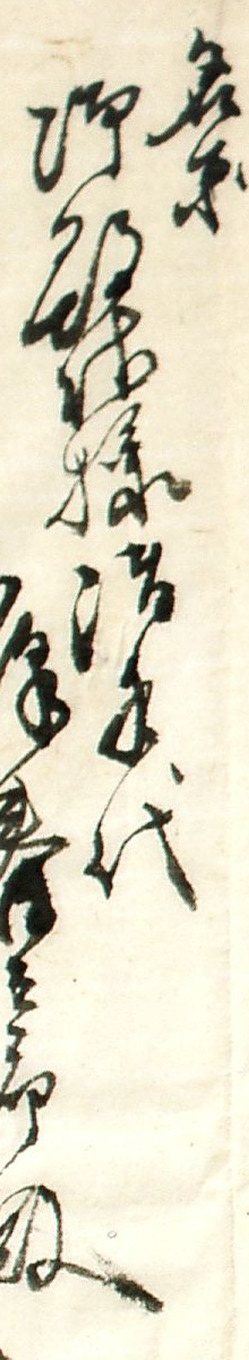御郡代様御手代
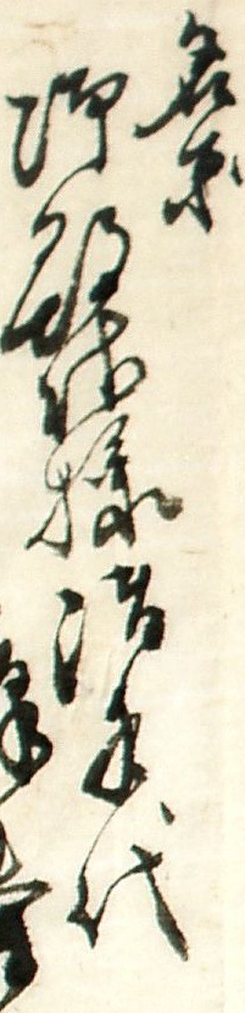御郡代様御手代
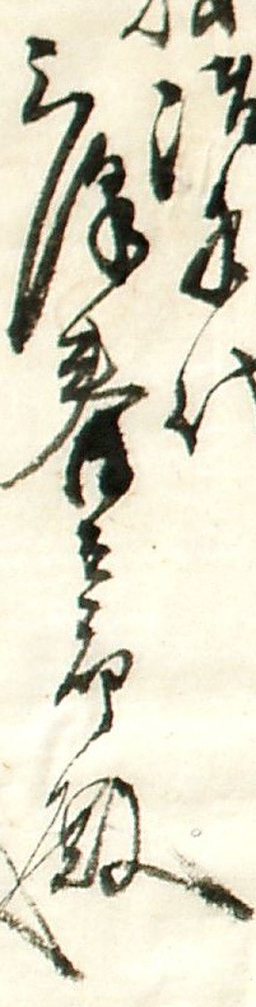三澤春太郎殿
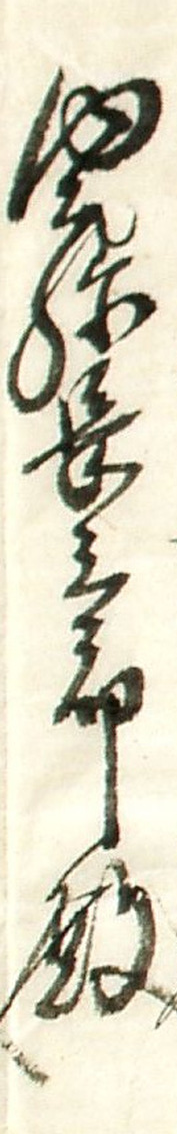内藤長三郎殿
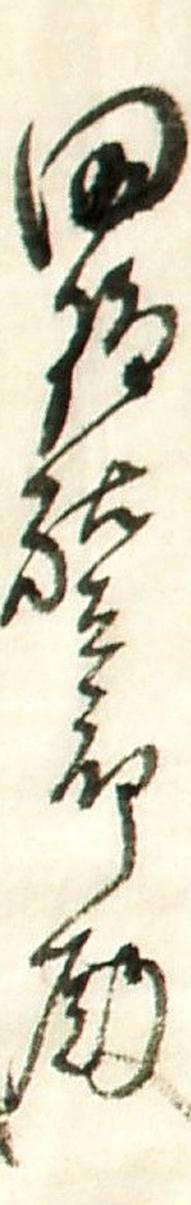田野祐太郎殿
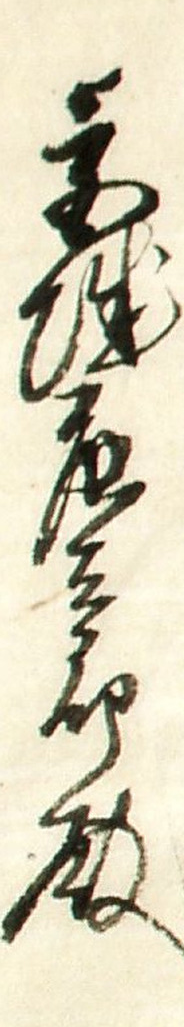宮城麻太郎殿

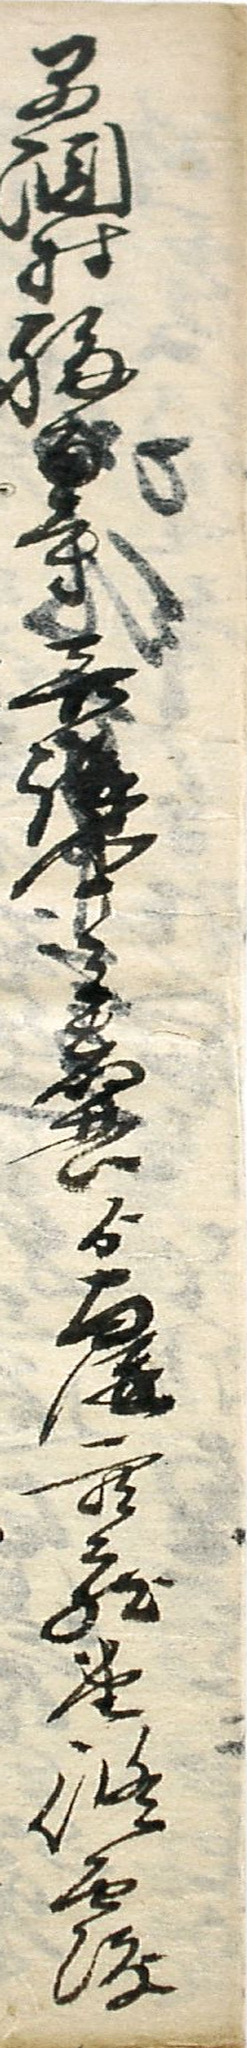早渕村福万寺幷講中之者共ゟ虚空蔵堂修覆
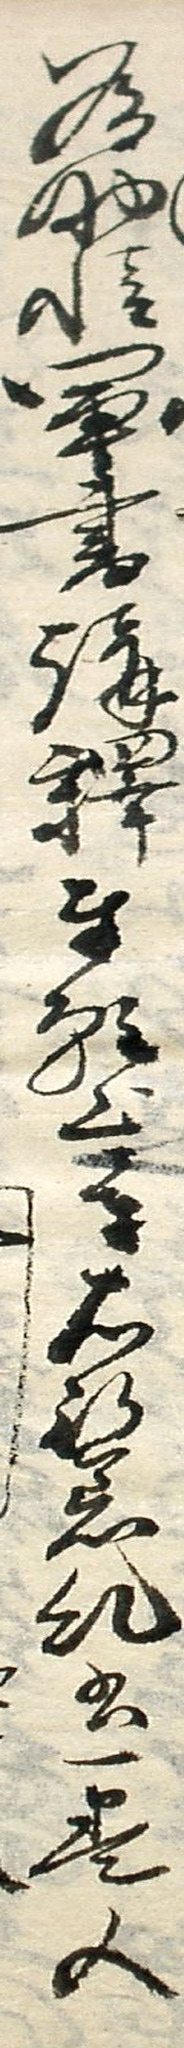為助情軍書講釋奉願上ニ付右行着糺書一巻入

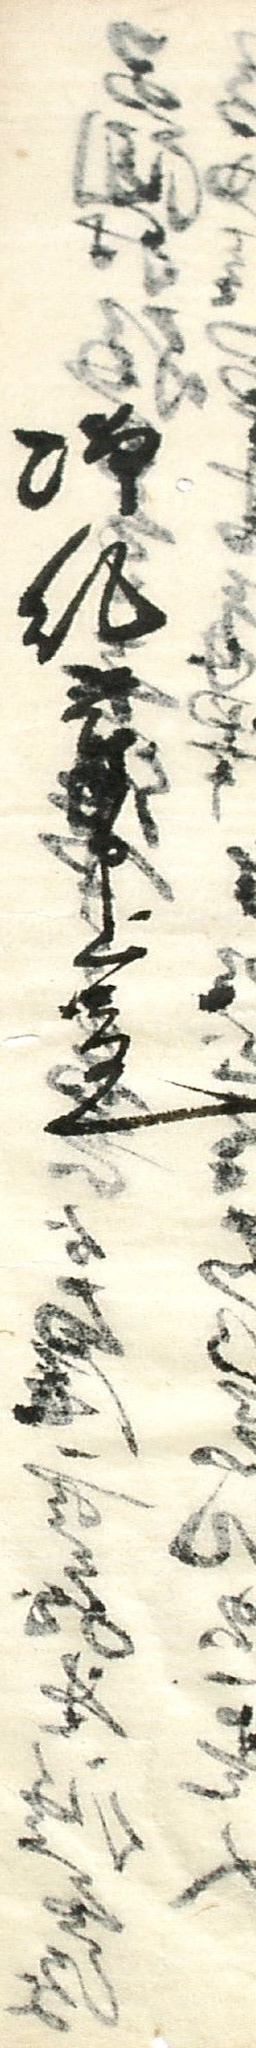御糺ニ付申上覚
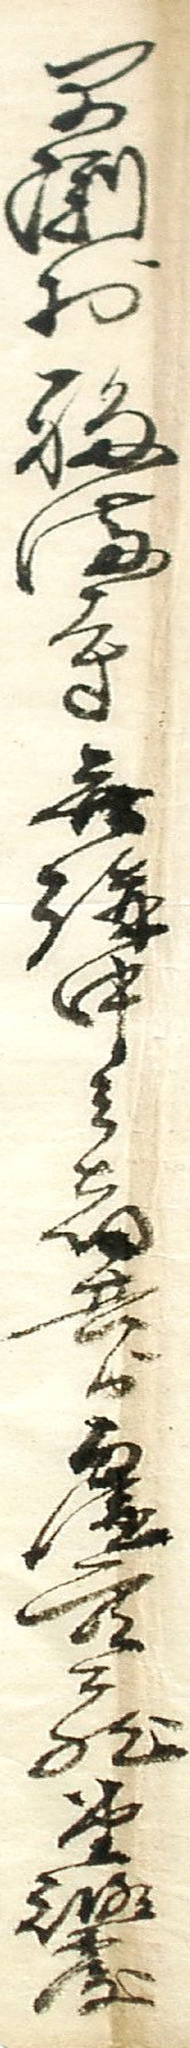早渕村福満寺幷講中之者共ゟ虚空蔵堂修覆
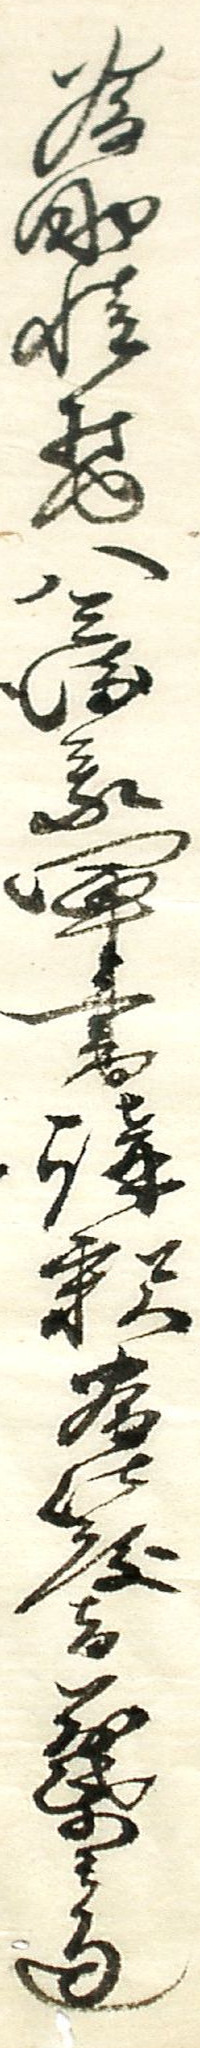為助情村内八兵衛義軍書講釈為仕度旨別帋之通
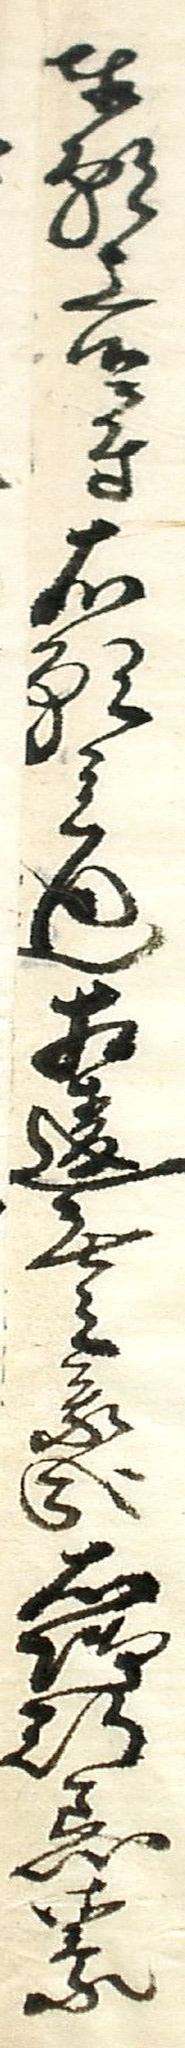奉願上候ニ付右願之通相違無之義哉右御行着御蒙
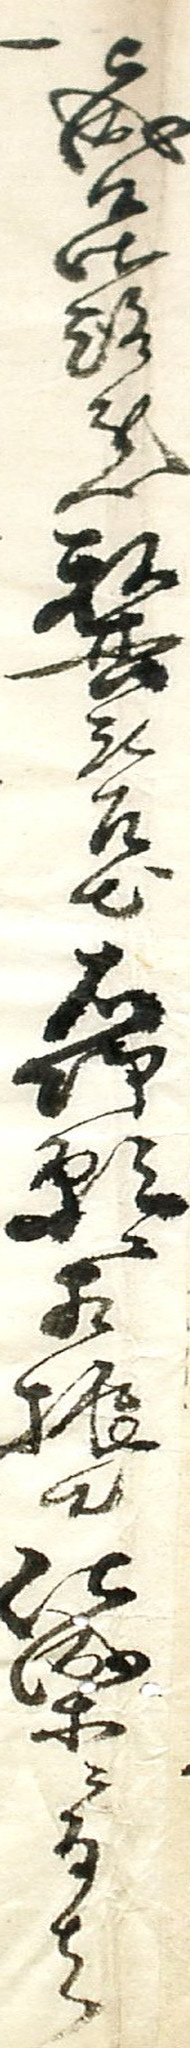被成候御趣を以私共被召出右御願ニ相振候仕成等ニ而者
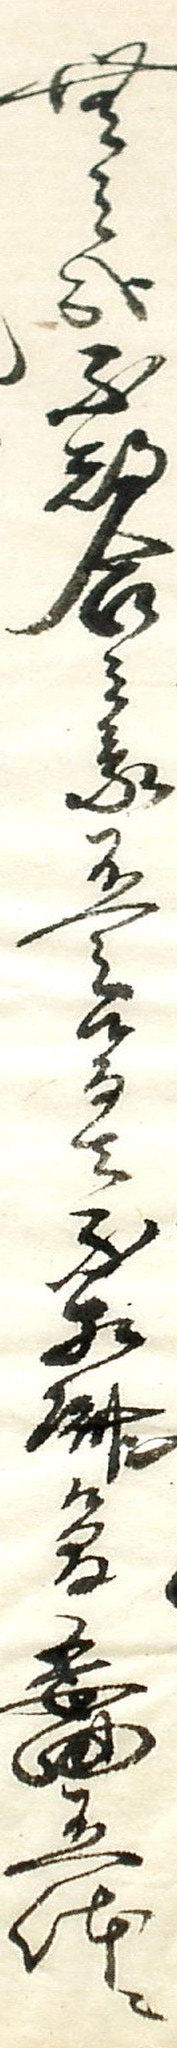無之哉不都合之義有之候而者不相済候間委曲有体ニ
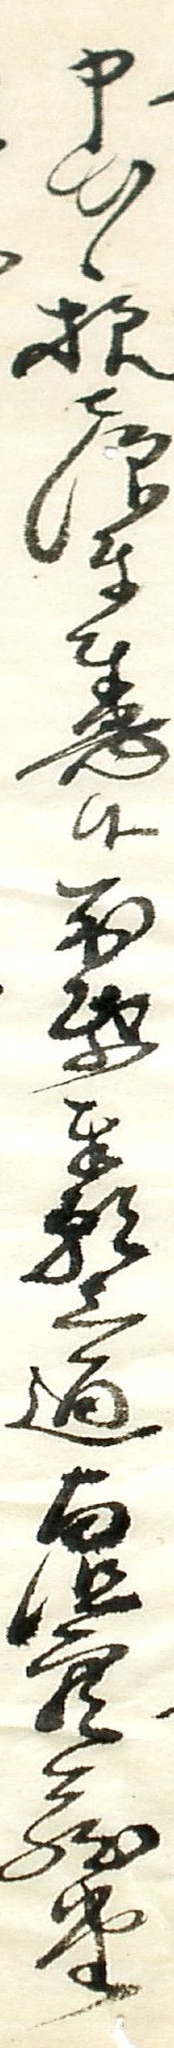申出候様被仰付奉畏候別帋奉願上通虚空蔵堂
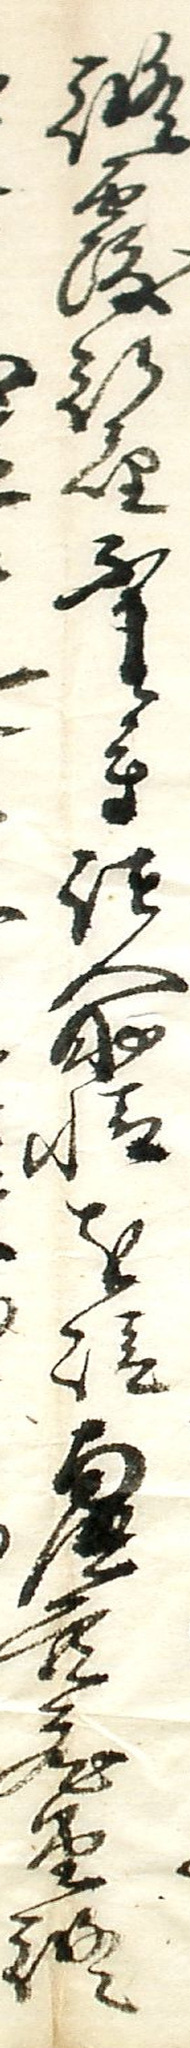修覆行届不申候ニ付諸人助情を請虚空蔵堂修
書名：（早渕村福満寺虚空蔵菩薩堂修復のためおどけ軍書講談願行着添え書控）
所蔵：鳴門教育大学 Naruto University of Education
